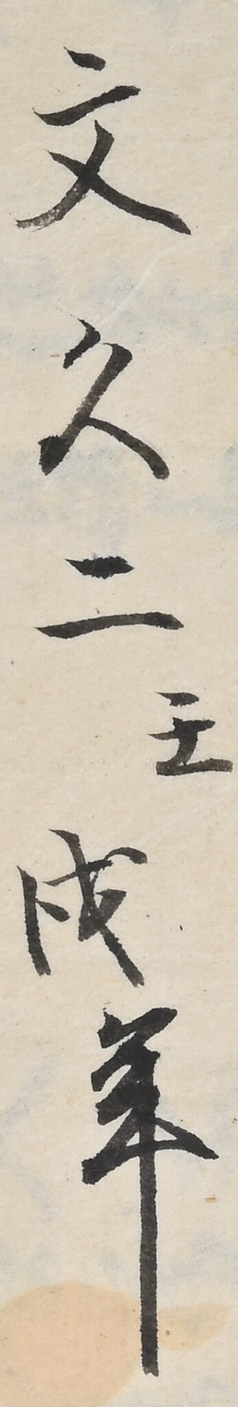㊞文久二壬戌年
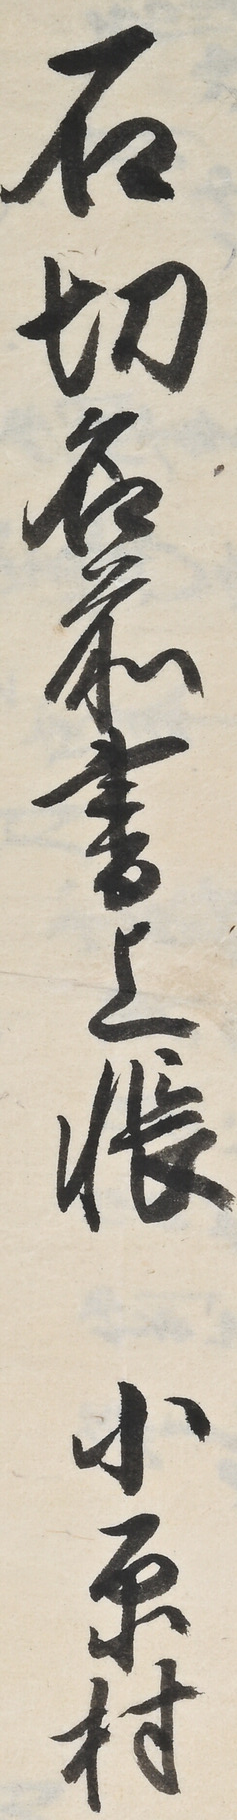石切名前書上帳小原村

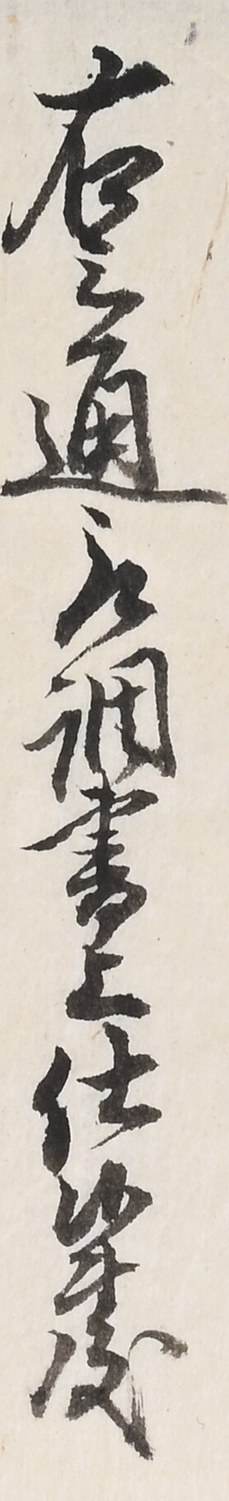右之通取調書上仕候處
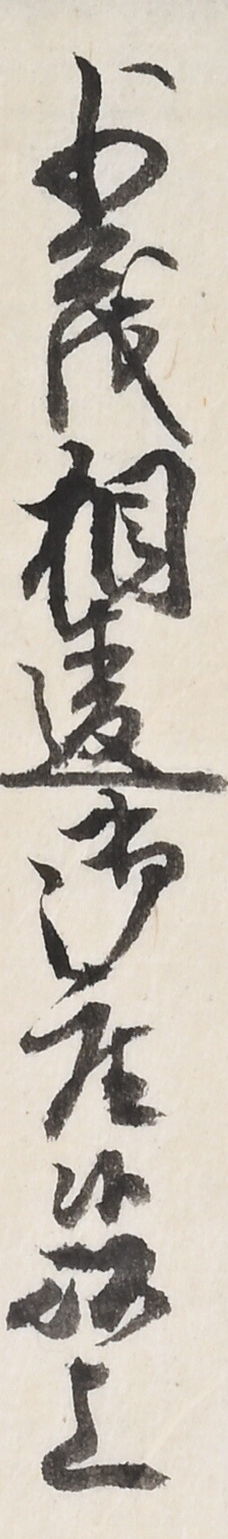少茂相違御座候以上
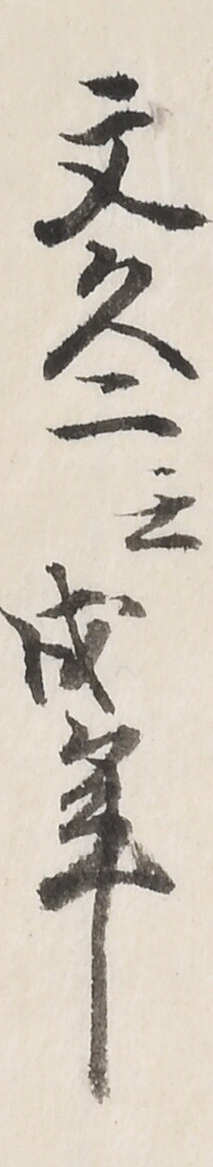文久二壬戌年
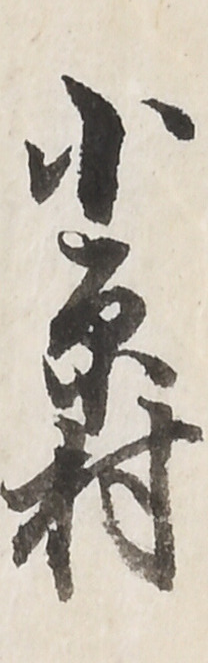小原村
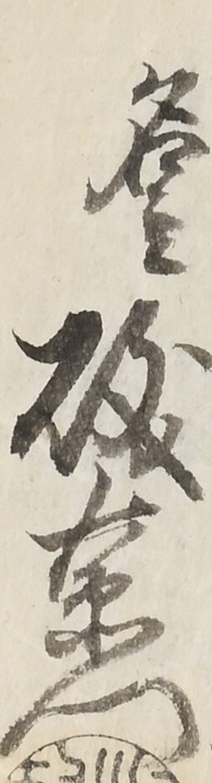名主磯右衛門(印)
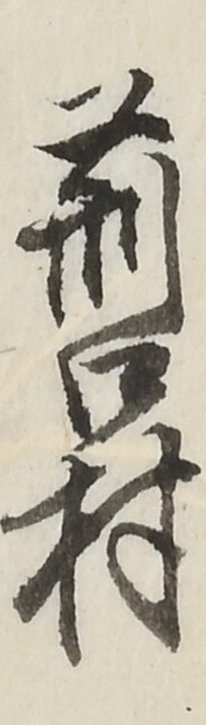荊口村
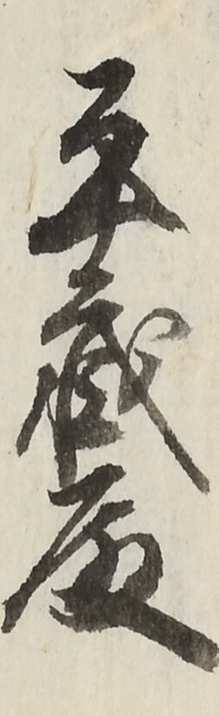平蔵殿
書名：文久二壬戌年二月石切名前書上帳
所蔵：伊那市立高遠町図書館・合同会社AMANE
